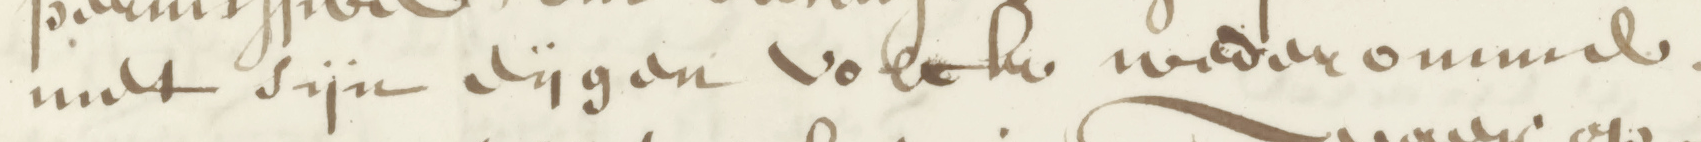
met sijn eijgen volck wederomme
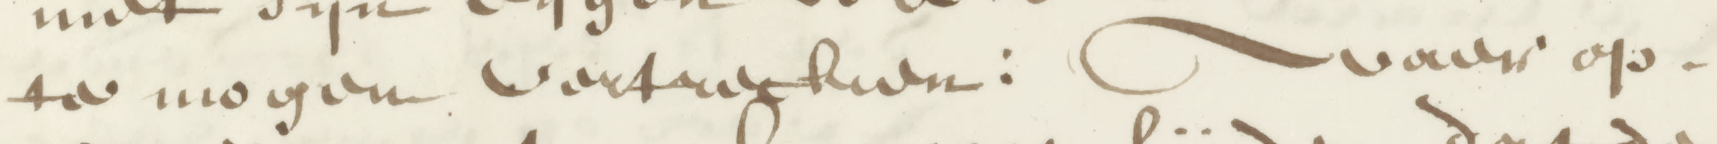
te mogen vertrecken: Waer op
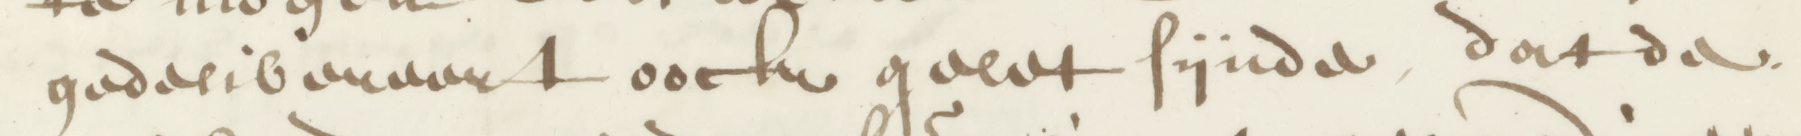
gedelibereert oock gelet sijnde, dat de
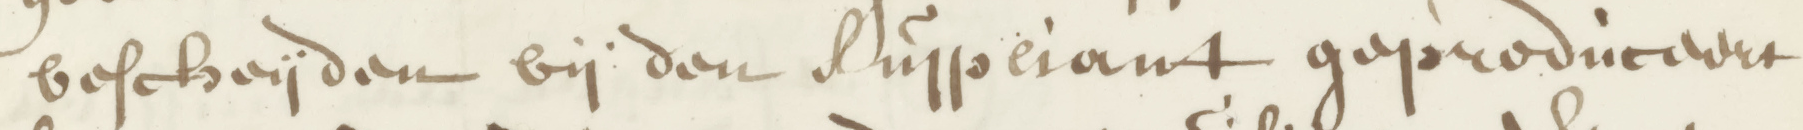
bescheijden bij den suppliant geproduceert
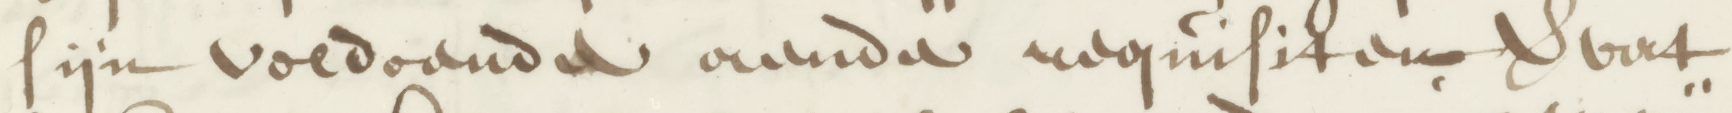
sijn voldoende aende requisiten vvat
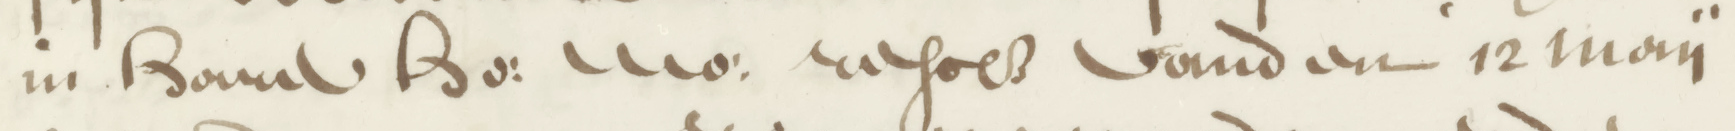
in hare Ho: Mo: resols. vanden 12 maij
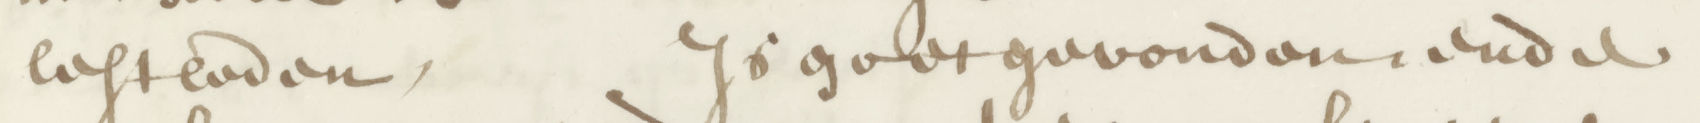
lestleden. Is goetgevonden ende
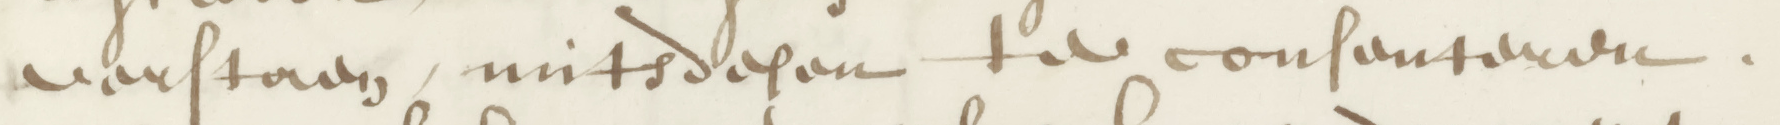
verstaen, mitsdesen te consenteren
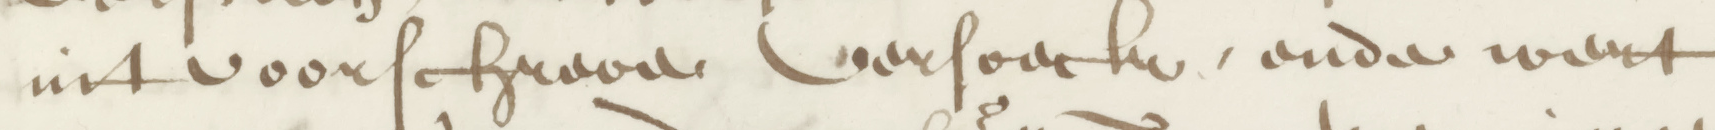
int voorschreve versoeck, ende wert
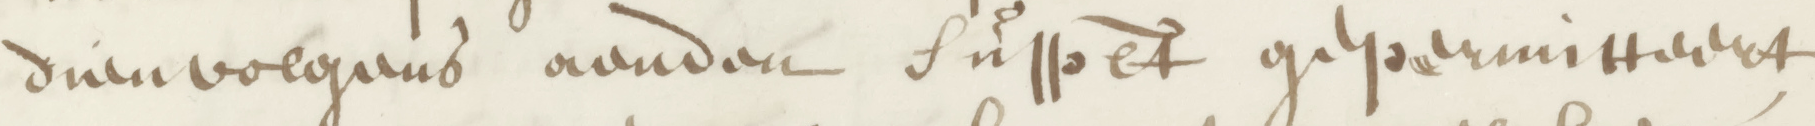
dienvolgens aenden supplt. gepermitteert,
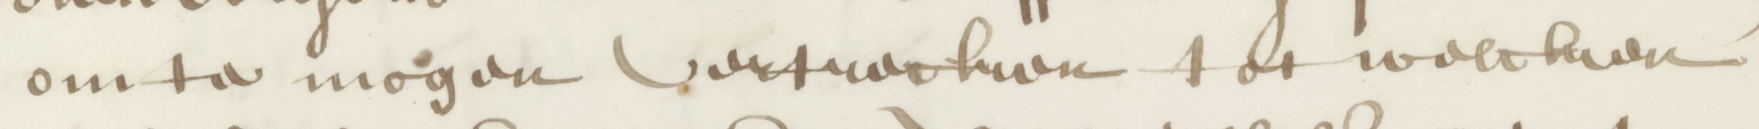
om te mogen vertrecken tot welcken
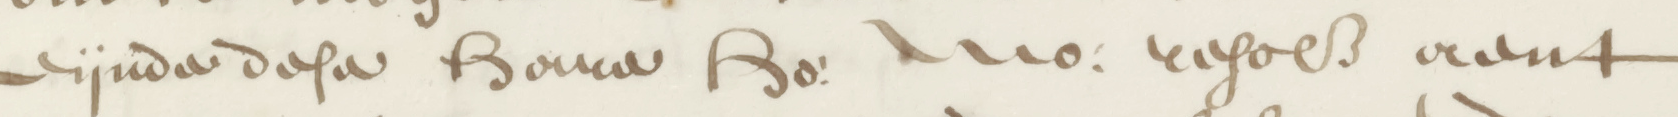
eijnde dese hare Ho: Mo: resols. aent
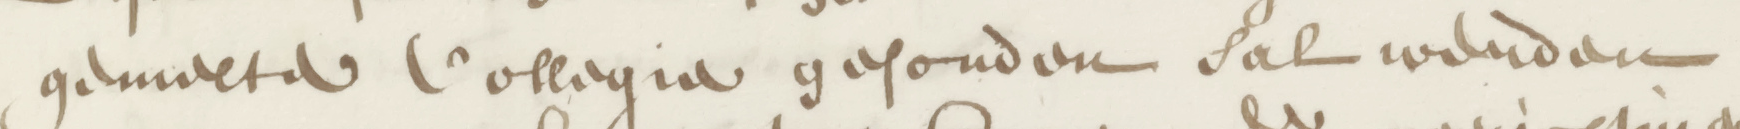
gemelte Collegie gesonden sal werden
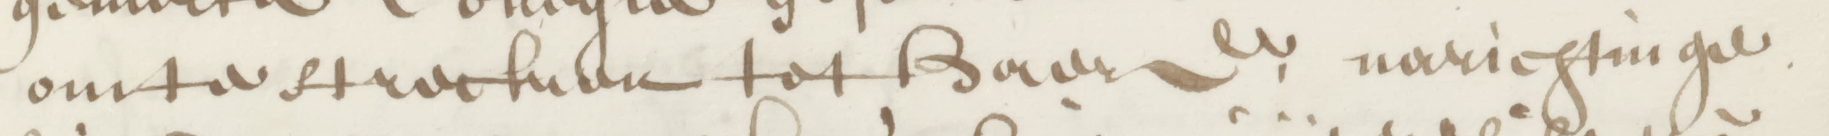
om te strecken tot haer E. narichtinge.
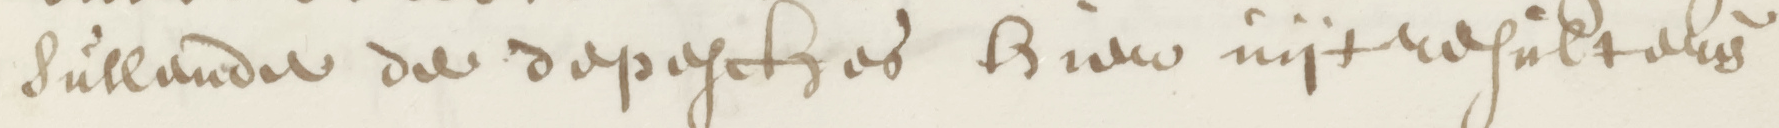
sullende de depesches hier uijt resulteren
